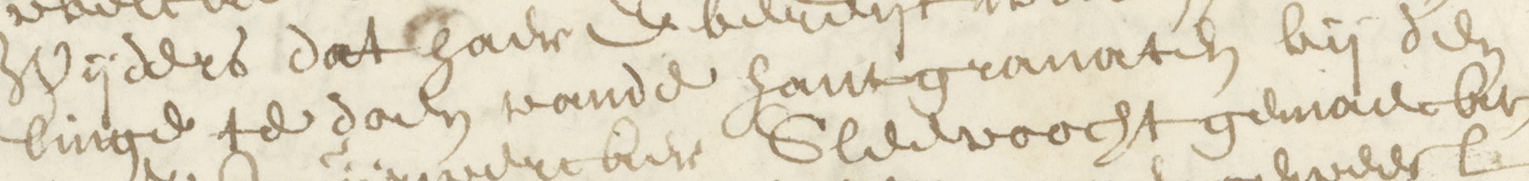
linge te doen vande hantgranaten bij den
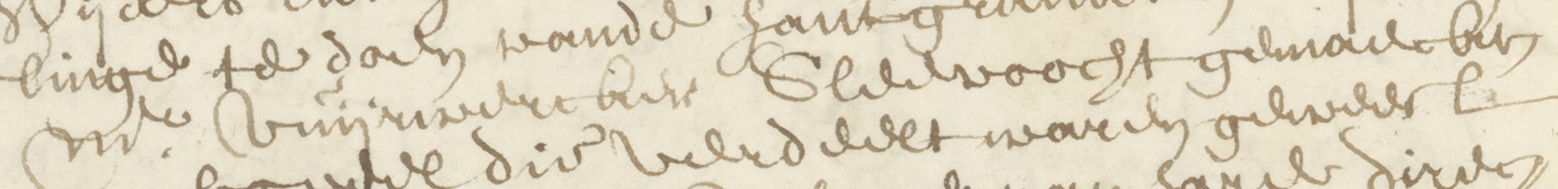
Mr. Vuijrwercker Sleevoocht gemaeckt,
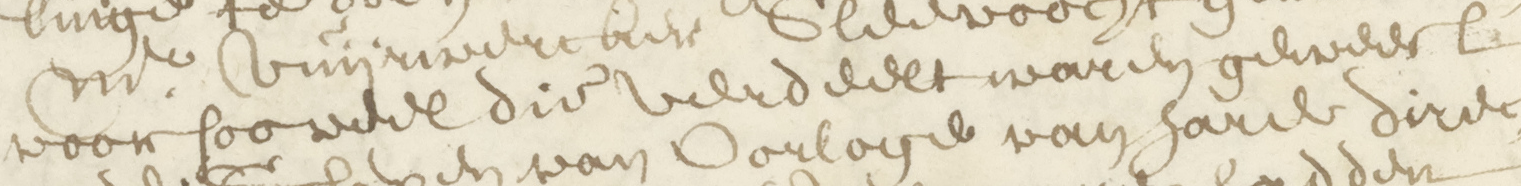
voor sooveel die verdeelt waren geweest
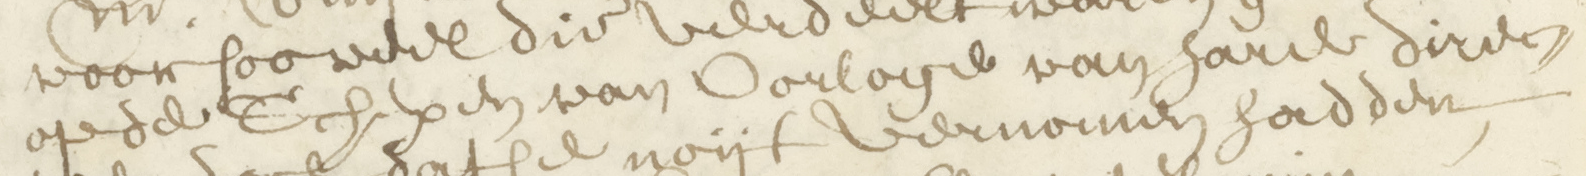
opde Schepen van Oorloge van hare direc,,
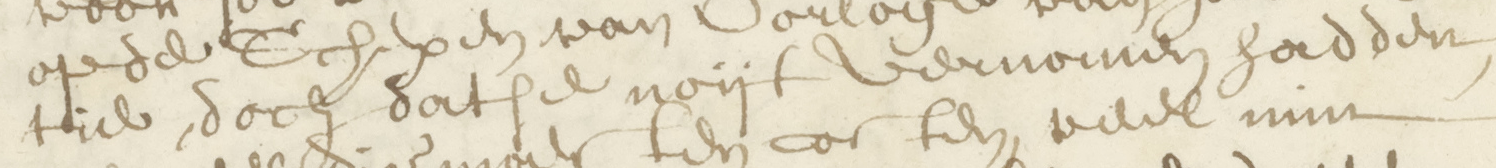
tie, doch datse noijt vernomen hadden
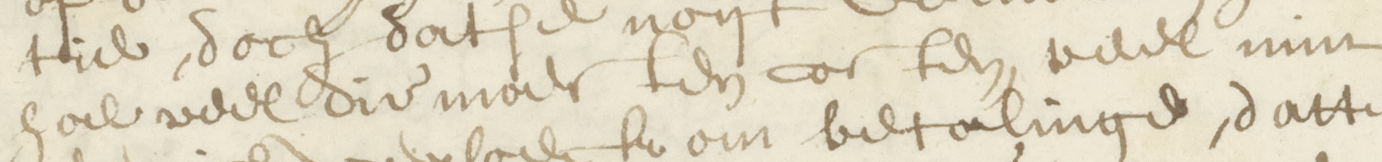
hoe veel die moesten costen, veel min
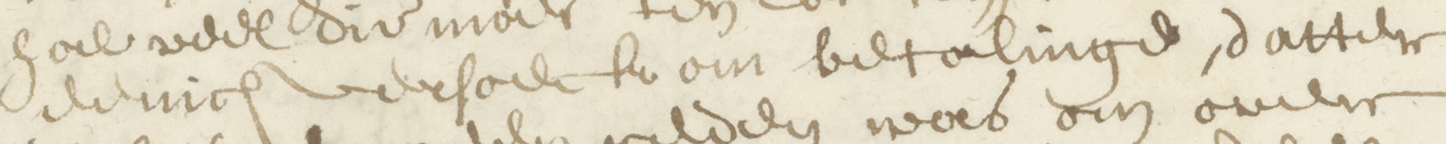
eenich versoeck om betalinge, datter
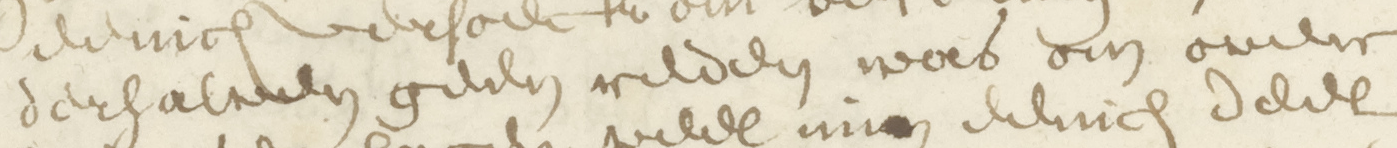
derhalven geen reden was om over
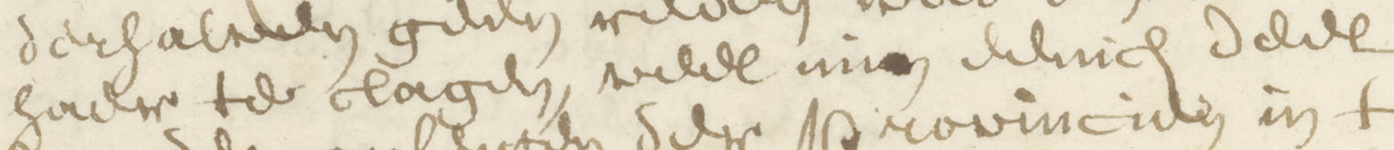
haer te clagen, veel min eenich deel
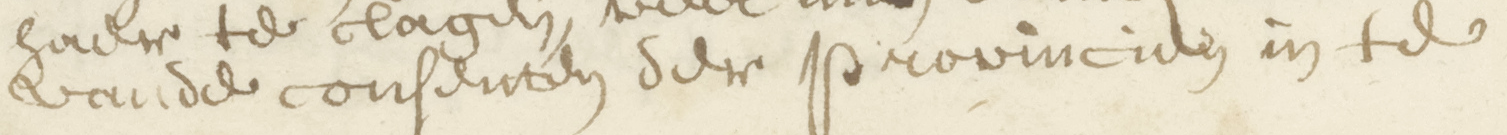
vande consenten der Provincien in te
